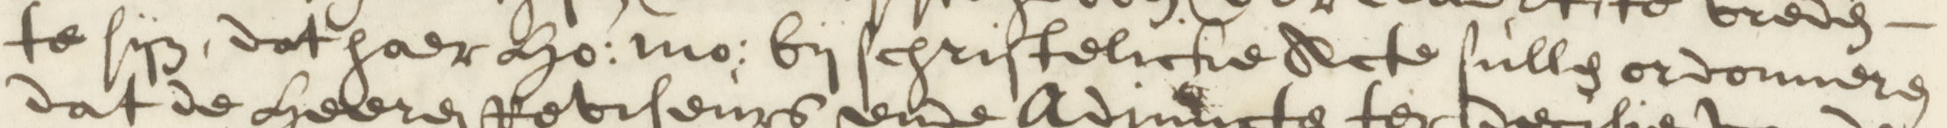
te sijn, dat haer Ho:Mo: bij schriftelicke Acte sullen ordonneren
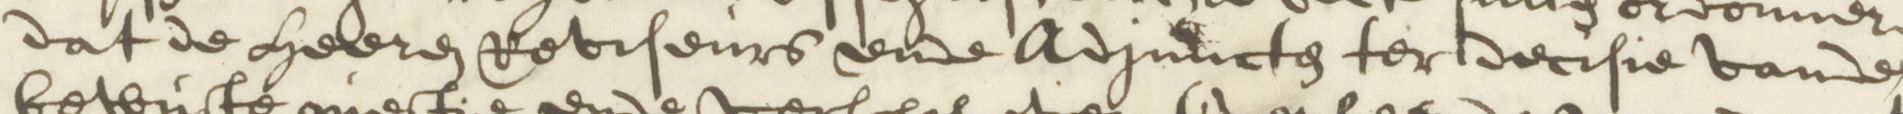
dat de heeren reviseurs ende adjuncten ter decisie vande
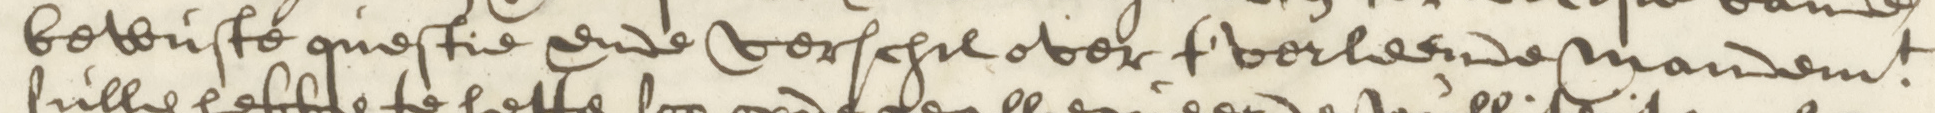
bewuste questie ende verschil over t'verleende mandemt.
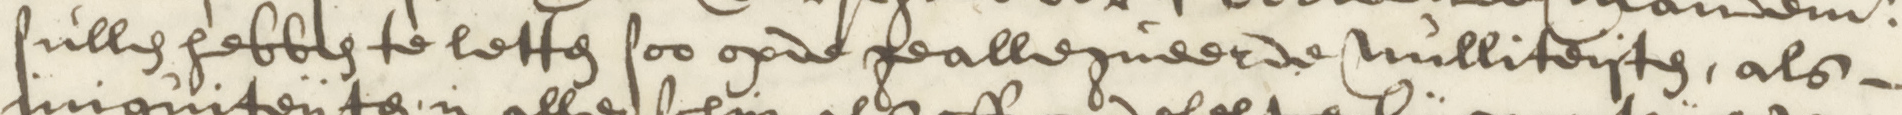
sullen hebben te letten soo opde geallegueerde nulliteijten, als -
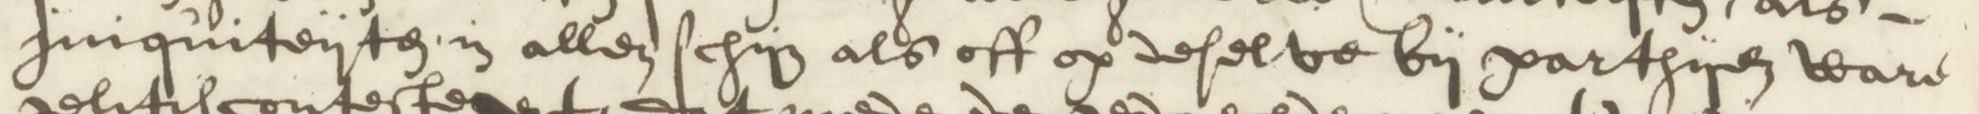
iniquiteijten in allen schijn als off op deselve bij parthijen ware
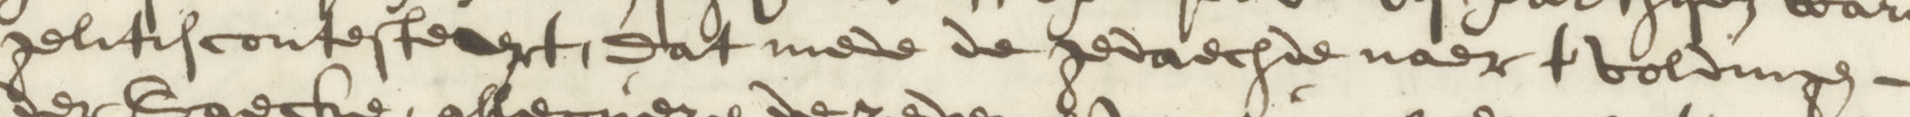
gelitiscontesteert, dat mede de gedaechde naer t'voldingen
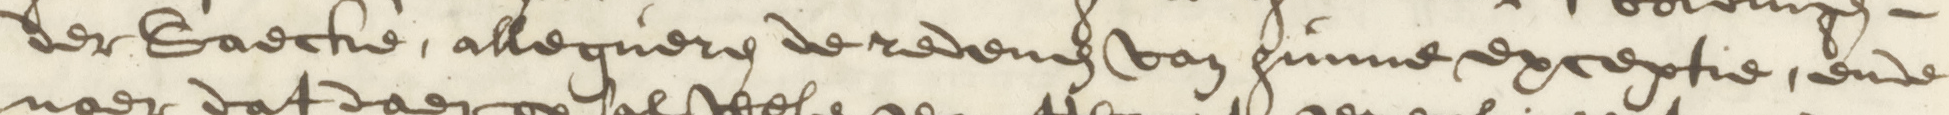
der saecke, alleguere de redenen van hunne exceptie, ende
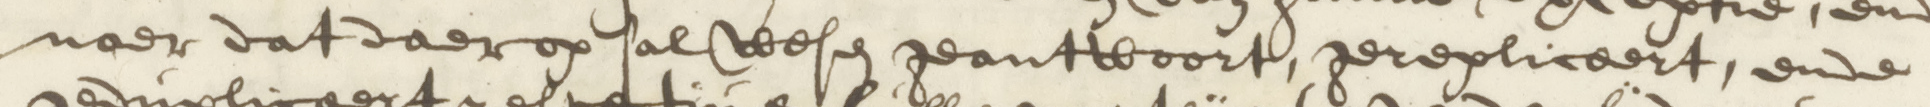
naer dat daerop sal wesen geantwoort, gerepliceert, ende
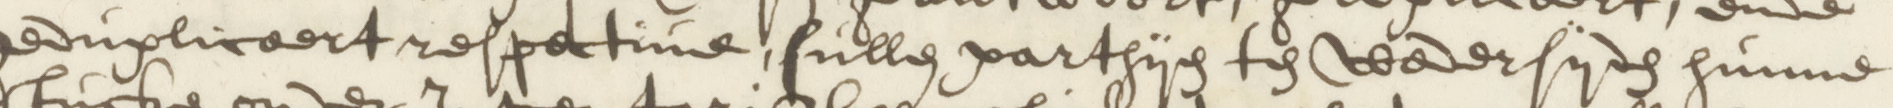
gedupliceert respectiue, sullen parthijen ten wedersijden hunne
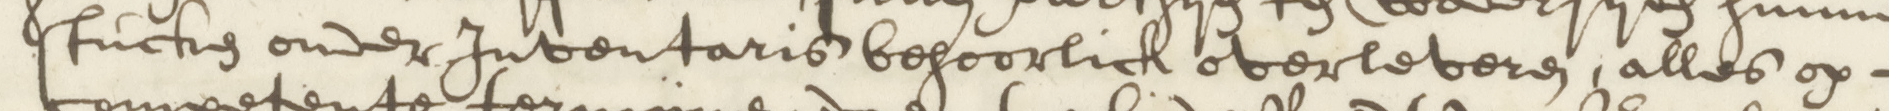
stucken onder inventaris behoorlick overleveren, alles op
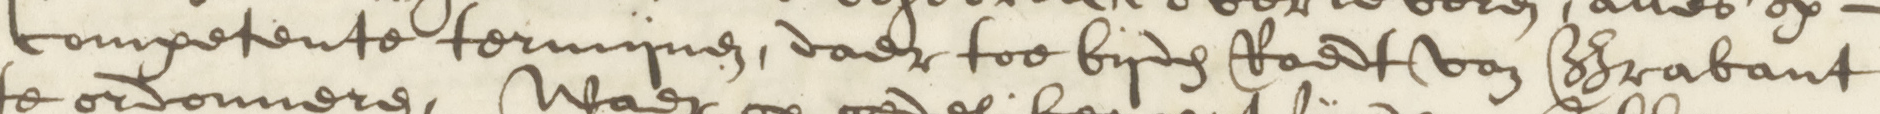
competente termijnen, daer toe bijden Raedt van Brabant
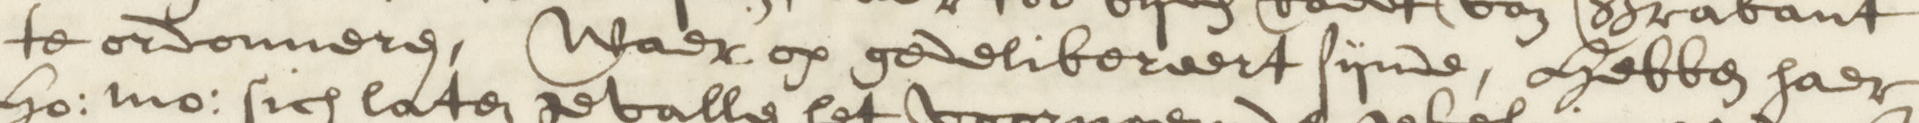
te ordonneren. Waerop gedelibereert sijnde, hebben haer
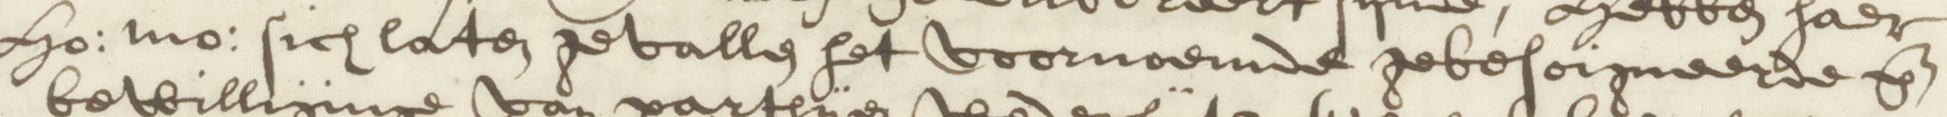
Ho:Mo: laten gevallen het voornoemde gebesoigneerde &
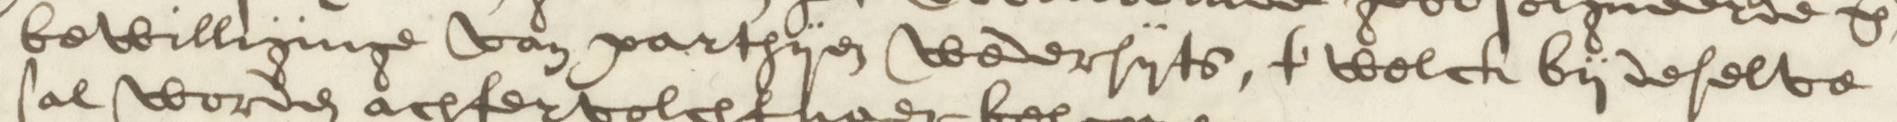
bewillinge van parthijen wedersijts, t'welck bij deselve
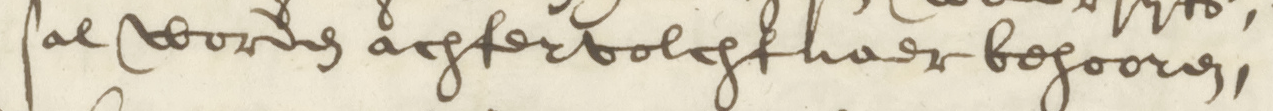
sal worden achtervolcht naer behooren.
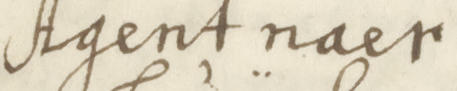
Agent naer
